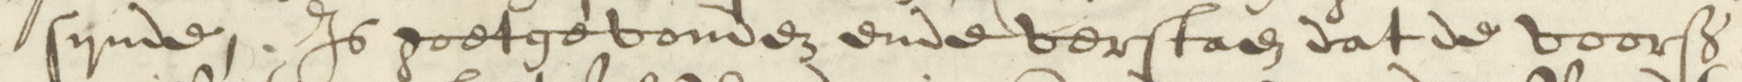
sijnde, Is goetgevonden ende verstaen dat de voorsz
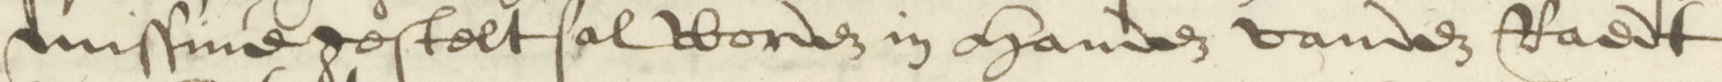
missive gestelt sal worden in handen vande Raedt
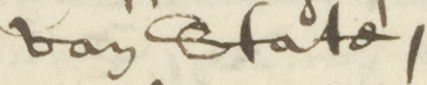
van State.
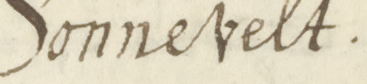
Sonnevelt
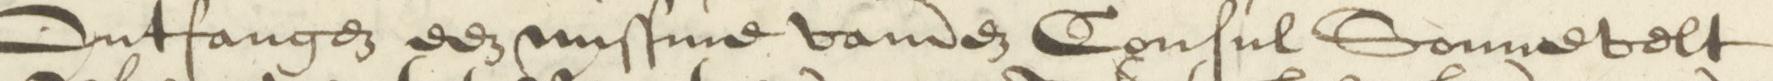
Ontfangen een missive vanden Consul Sonnevelt
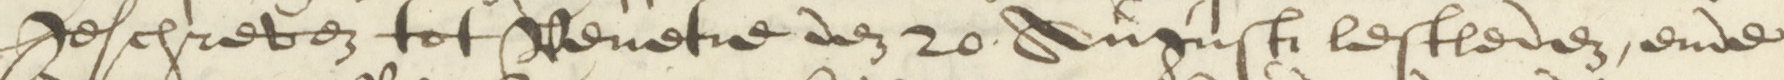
geschreven tot Venetie den 20. Augusti lestleden, ende
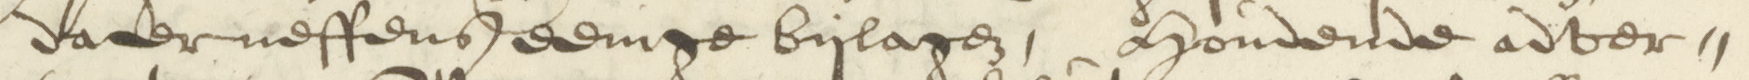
daer neffens eenige bijlagen, houdende adver„
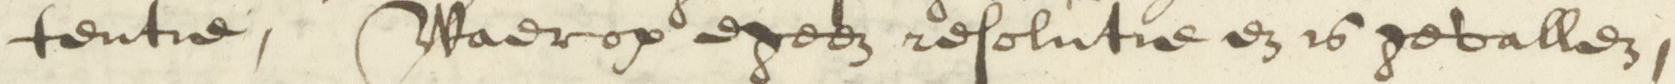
tentie, Waerop egeen resolutie en is gevallen.
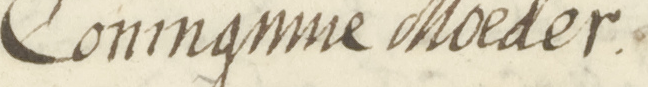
Coninginne moeder
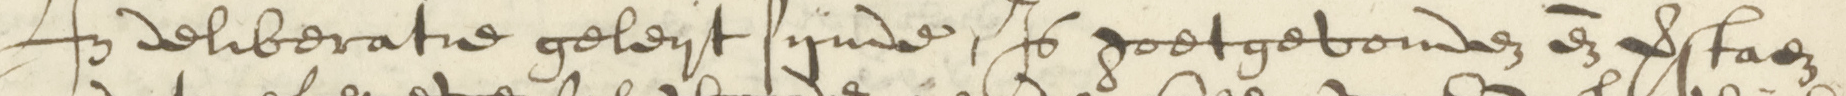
In deliberatie geleijt sijnde, Is goetgevonden en vstaen
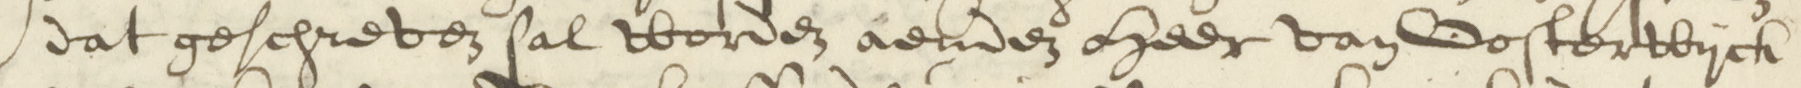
dat geschreven sal woren aenden heer van Oosterwijck
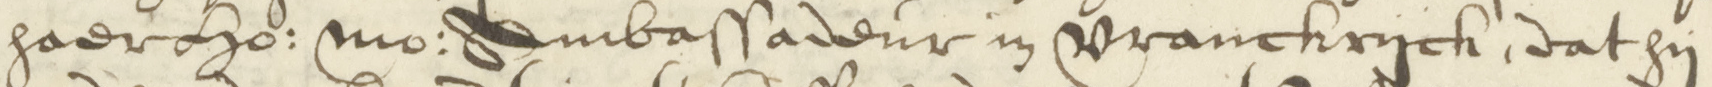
haer Ho:Mo: Ambassadeur in Vranckrijck, dat hji
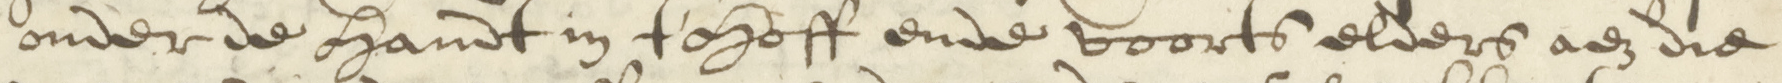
onder de handt in t'hoff ende voorts elders aen die
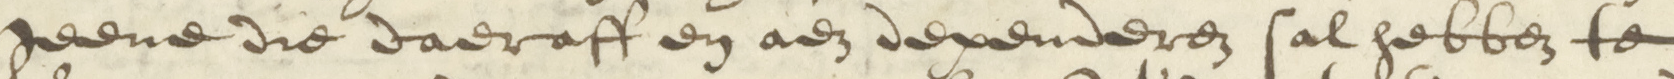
geene die daeraff en aen dependeren sal hebben te
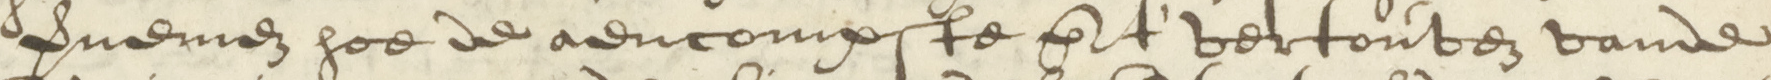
vnemen hoe de aencompste & t'vertouven vande
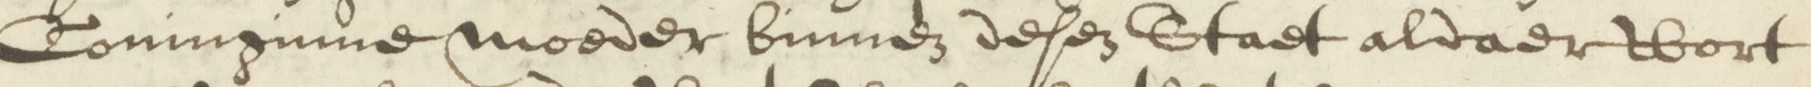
Coninginne moeder binnen desen Staet aldaer wort
